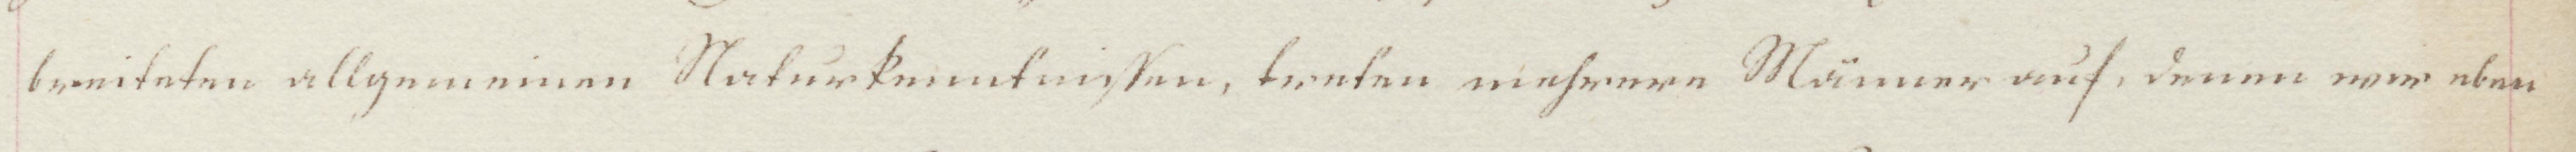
breiteten allgemeinen Naturkenntnissen, treten mehrere Männer auf, denen wir eben
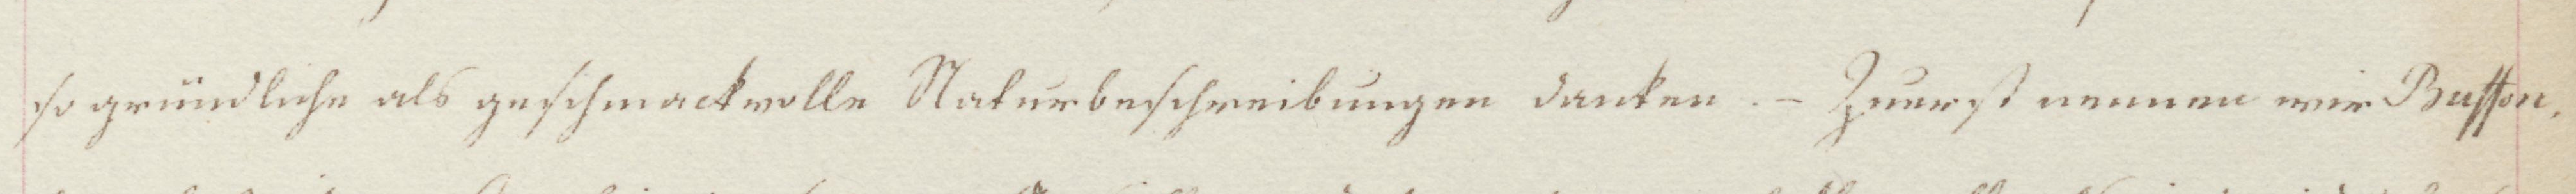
so gründliche als geschmackvolle Naturbeschreibungen danken. – Zuerst nennen wir Buffon,
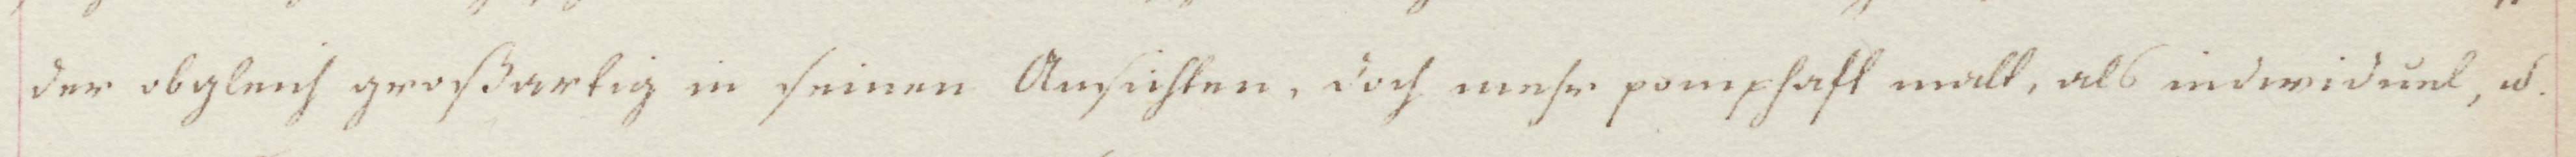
der obgleich großartig in seinen Ansichten, doch mehr pomphaft malt, als individuel, u.
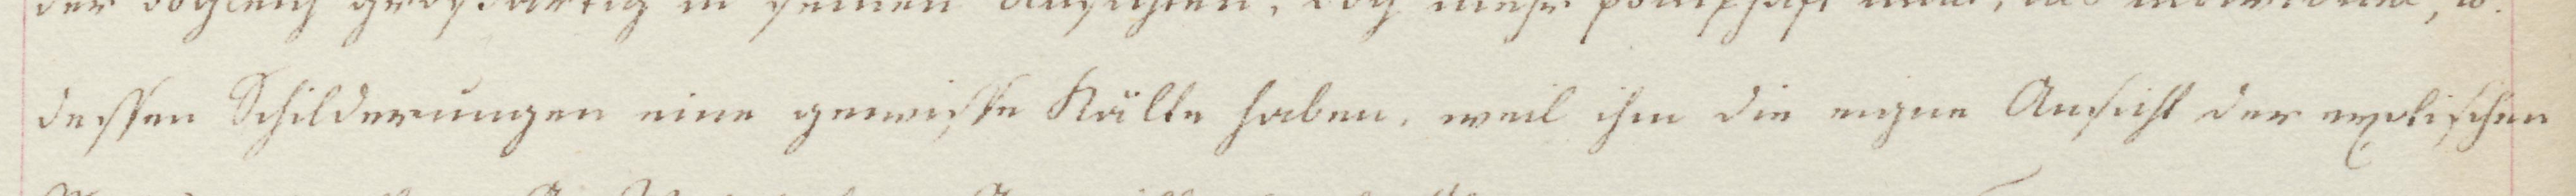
dessen Schilderungen eine gewisse Kälte haben, weil ihn die eigne Ansicht der exotischen
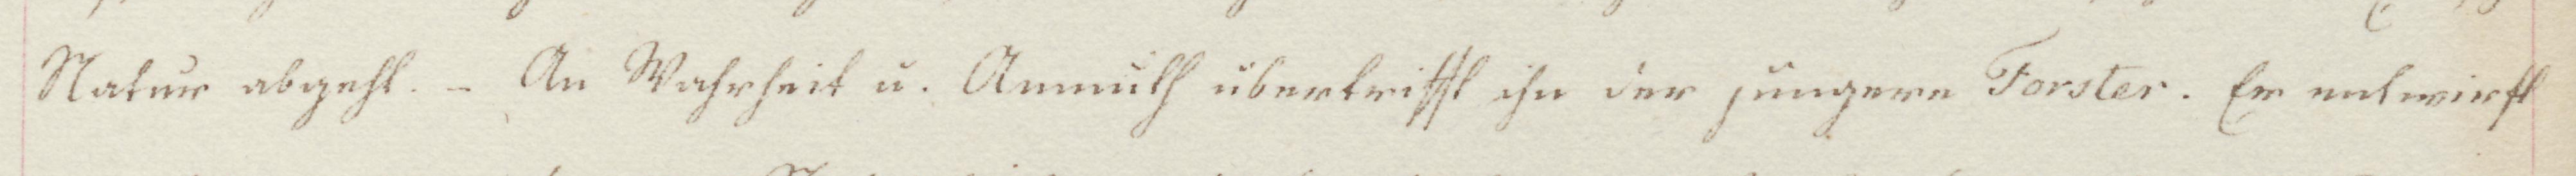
Natur abgeht. – An Wahrheit und Anmuth übertrifft ihn der jüngere Forster. Er entwirft
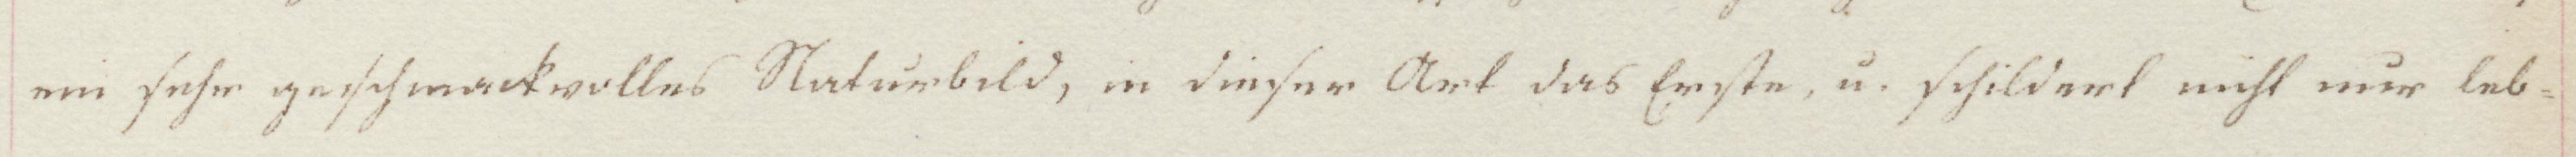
ein sehr geschmackvolles Naturbild, in dieser Art das Erste, u. schildert nicht nur leb-
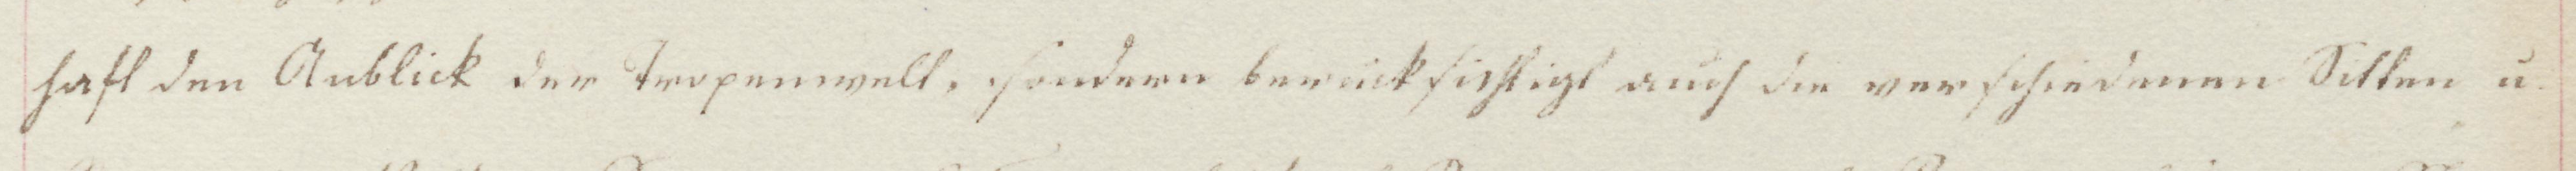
haft den Anblick der Tropenwelt, sondern berücksichtigt auch die verschiedenen Sitten u.
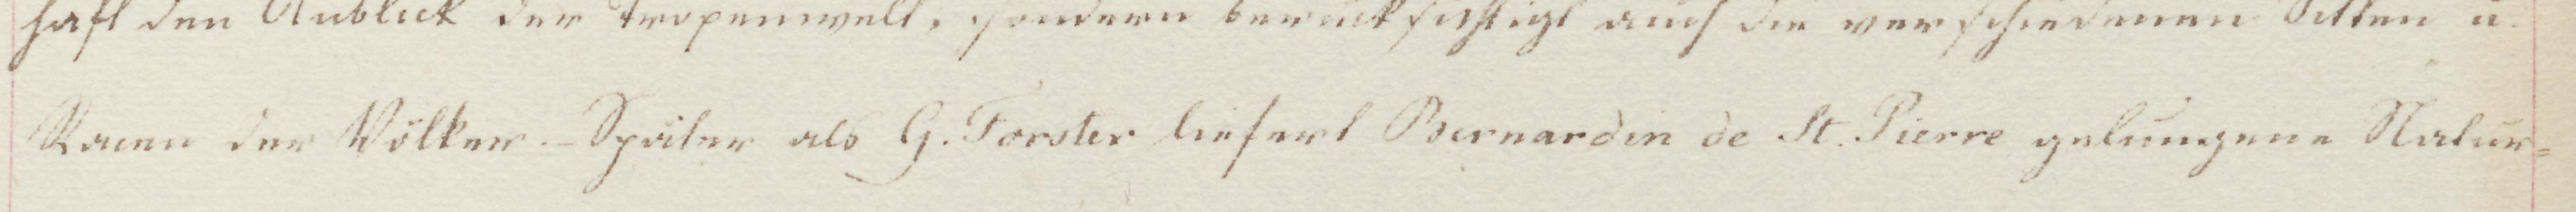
Racen der Völker. – Später als G. Forster liefert Bernardin de St. Pierre gelungene Natur-
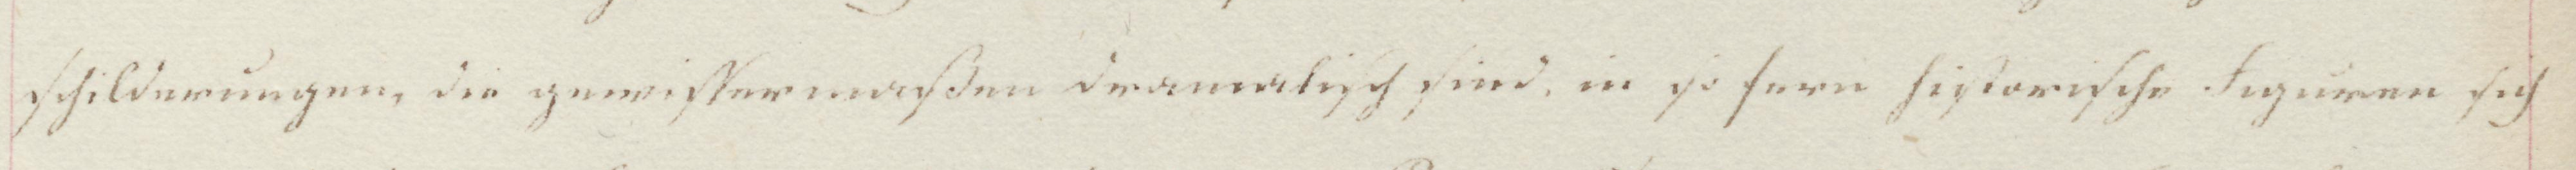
schilderungen, die gewissermaßen dramatisch sind, in so fern historische Figuren sich
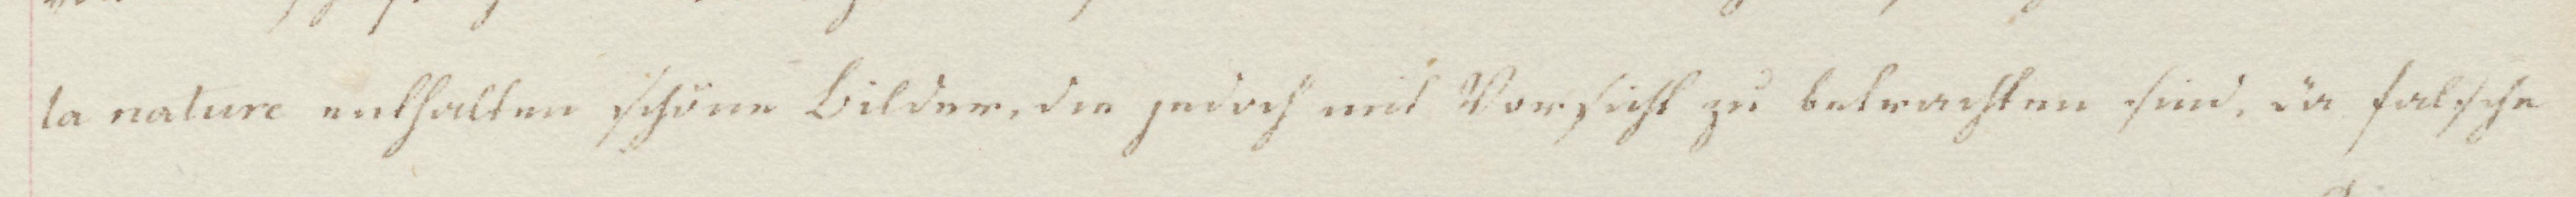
la nature enthalten schöne Bilder, die jedoch mit Vorsicht zu betrachten sind, da falsche
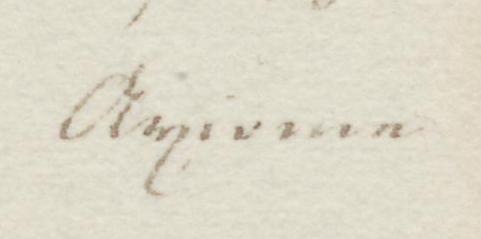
Axiome
